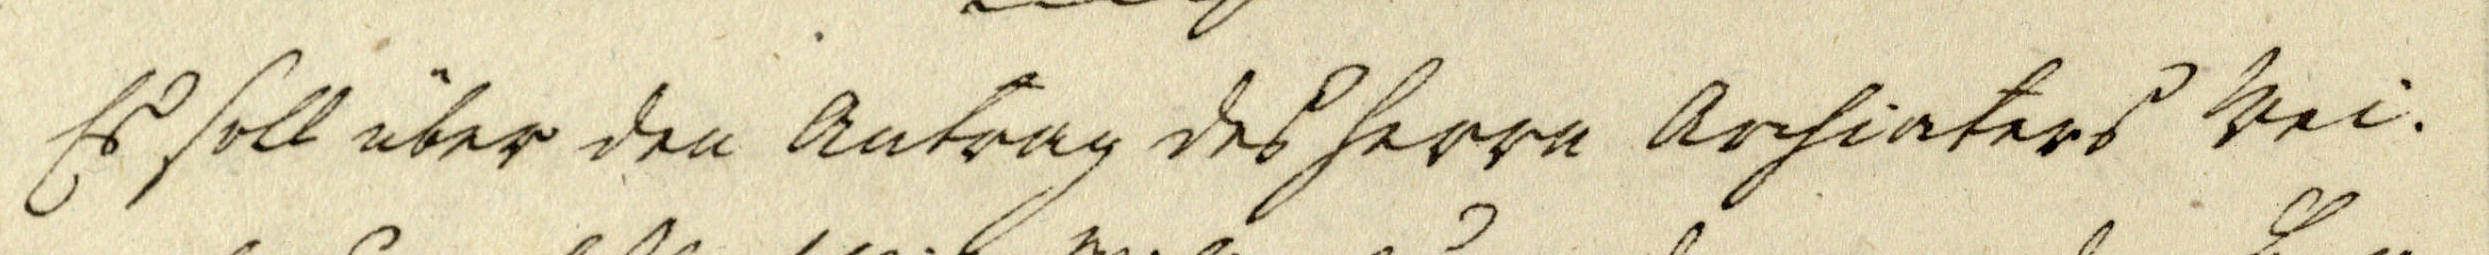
Es soll über den Antrag des Herrn Archiaters Wei¬
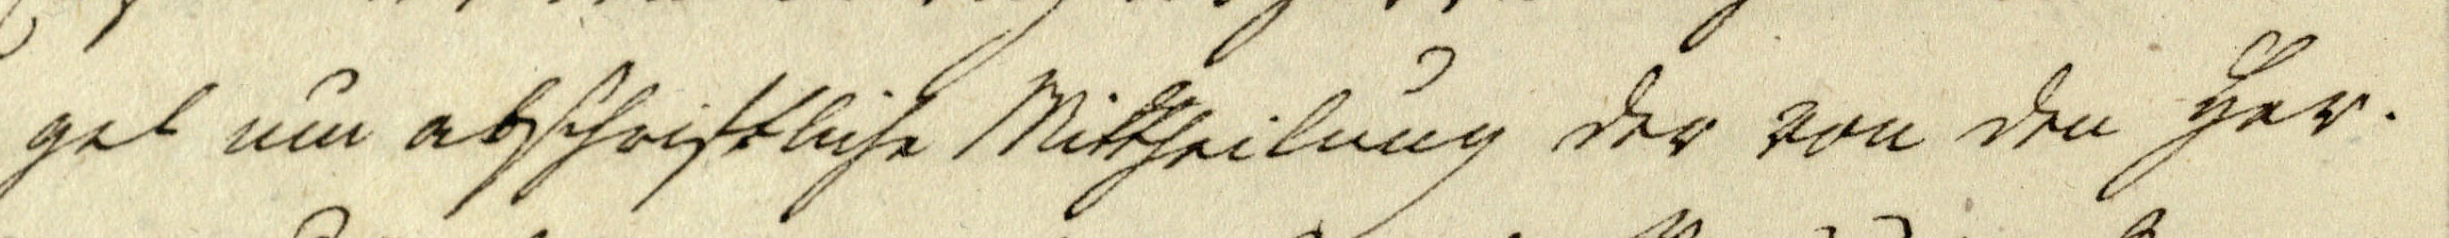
gel um abschriftliche Mittheilung der von den Her¬
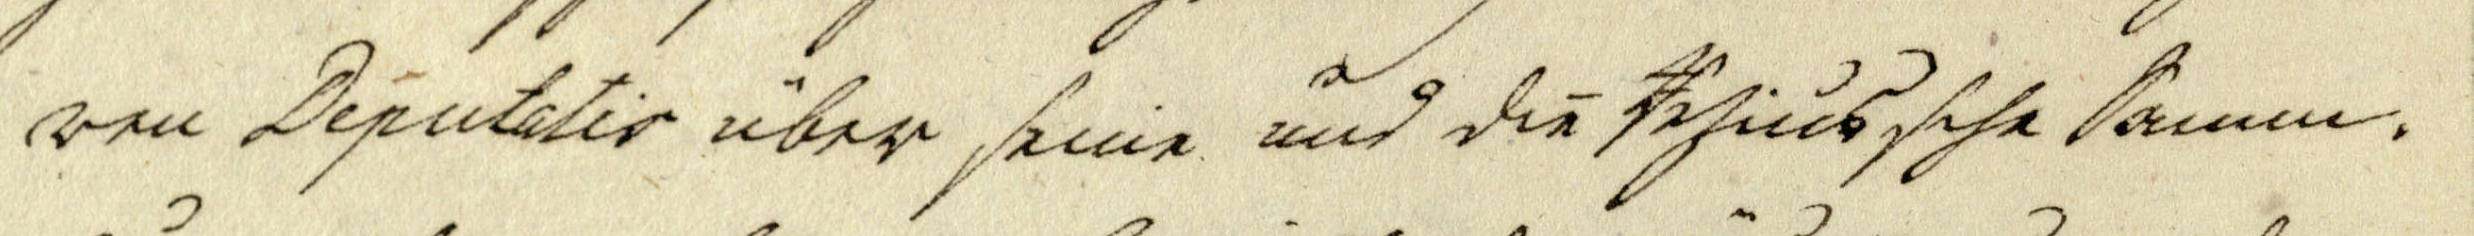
ren Deputatis über seine und die Reziussche Samm¬
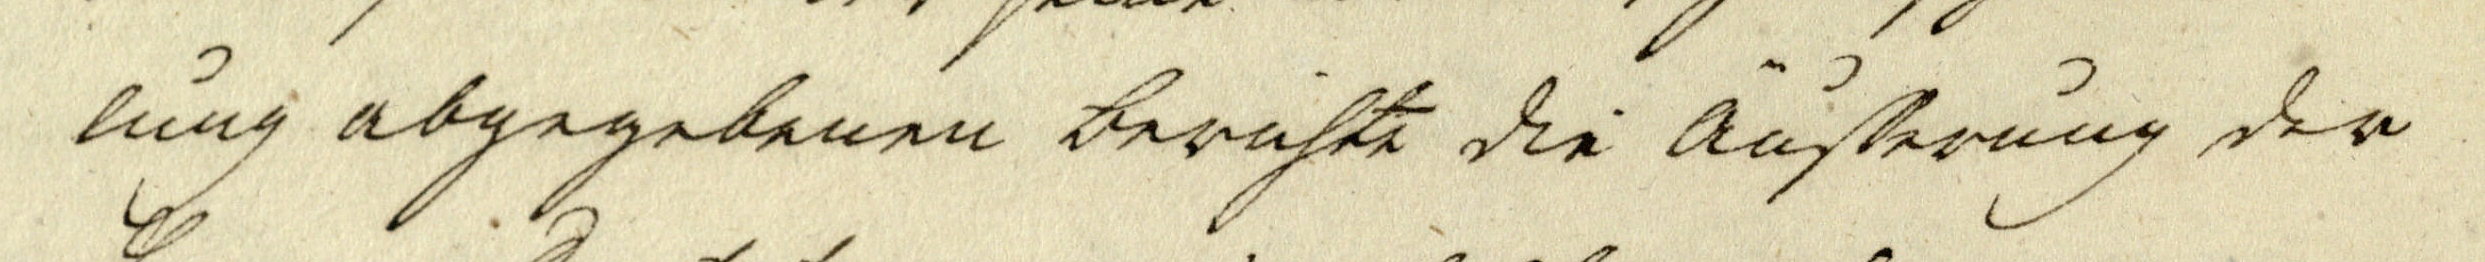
lung abgegebenen Berichte die Äusserung der
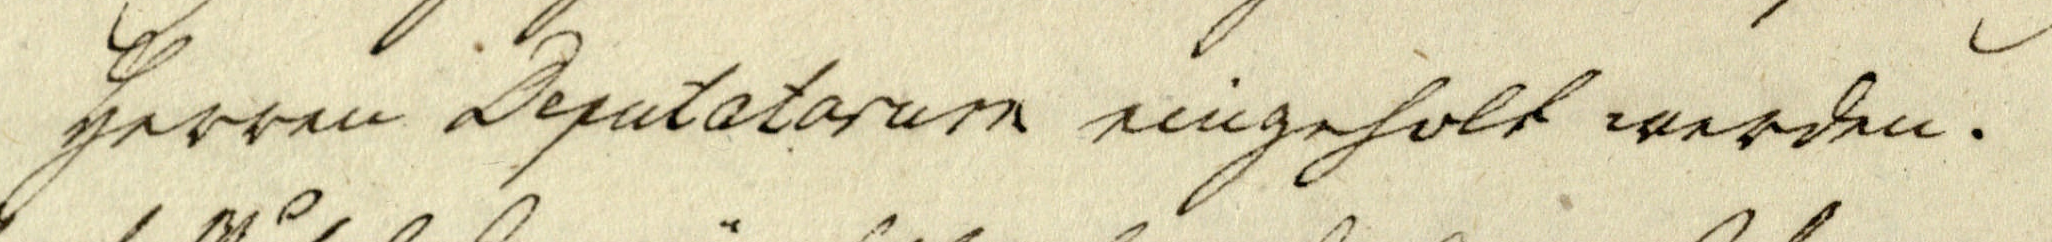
Herren Deputatorum eingeholt werden.
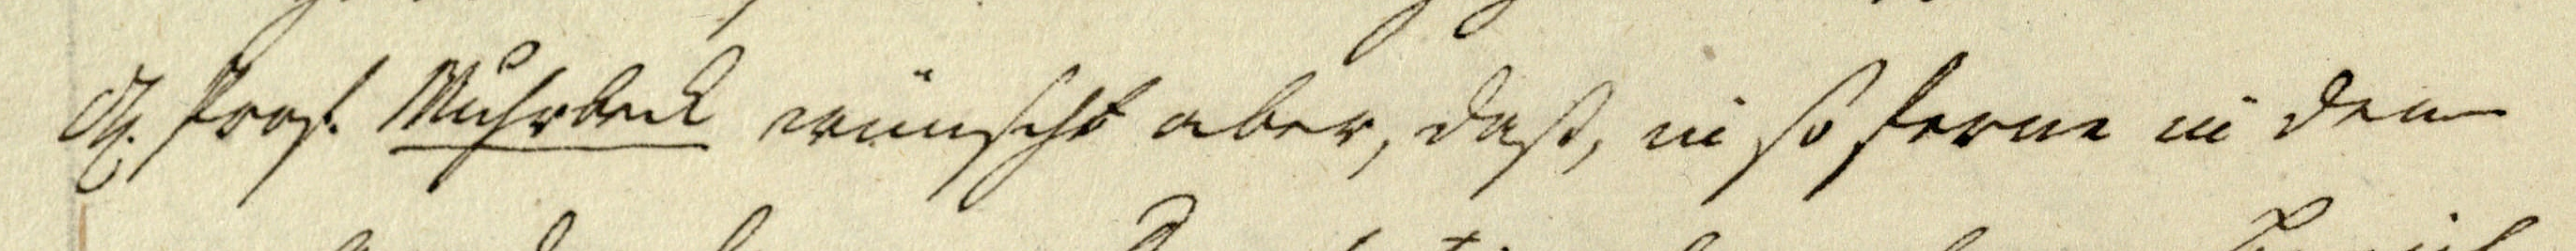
dh. Prof. Muhrbeck wünscht aber, daß, in so ferne in den
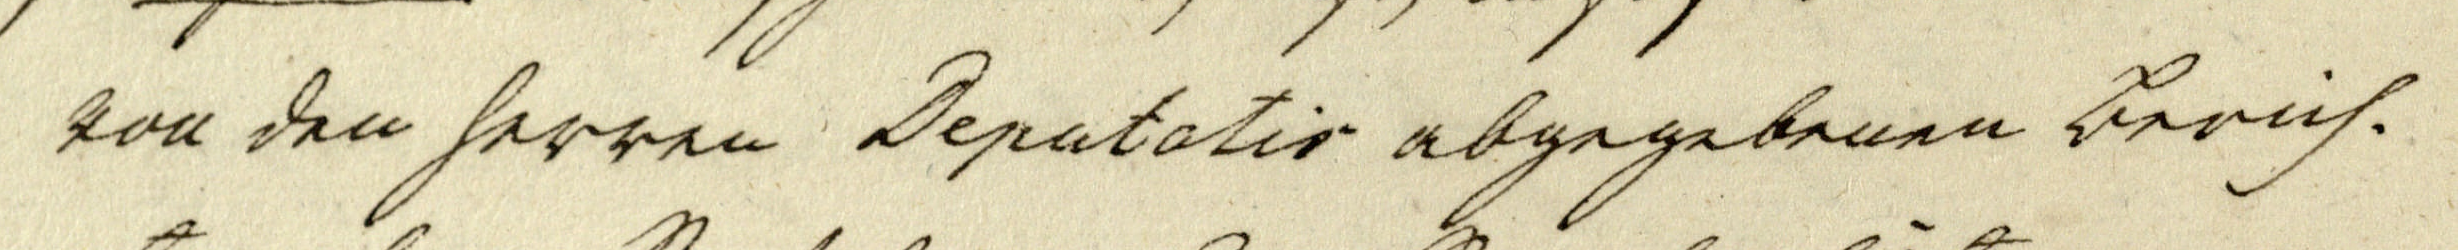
von den Herren Deputatis abgegebenen Berich¬
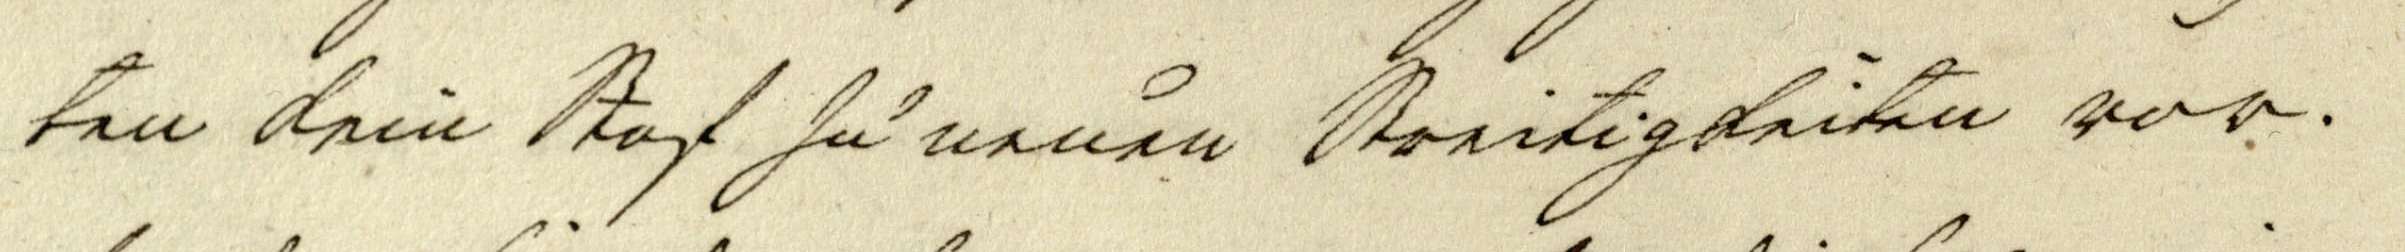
ten kein Stof zu neuen Streitigkeiten vor¬
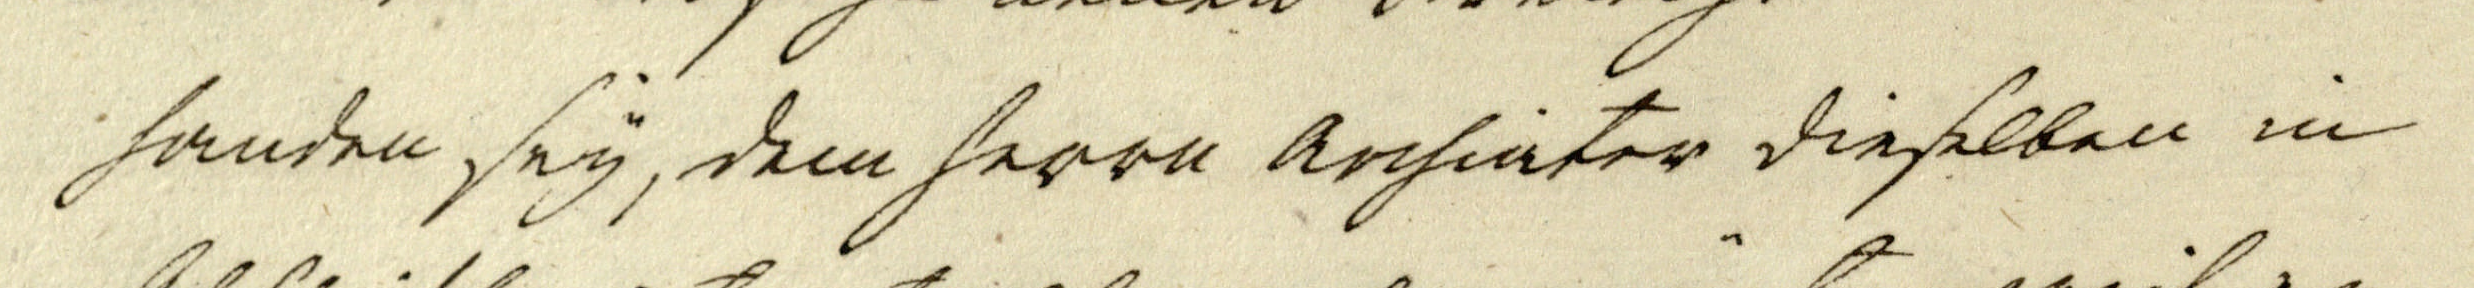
handen seÿ, dem Herrn Archiater dieselben in
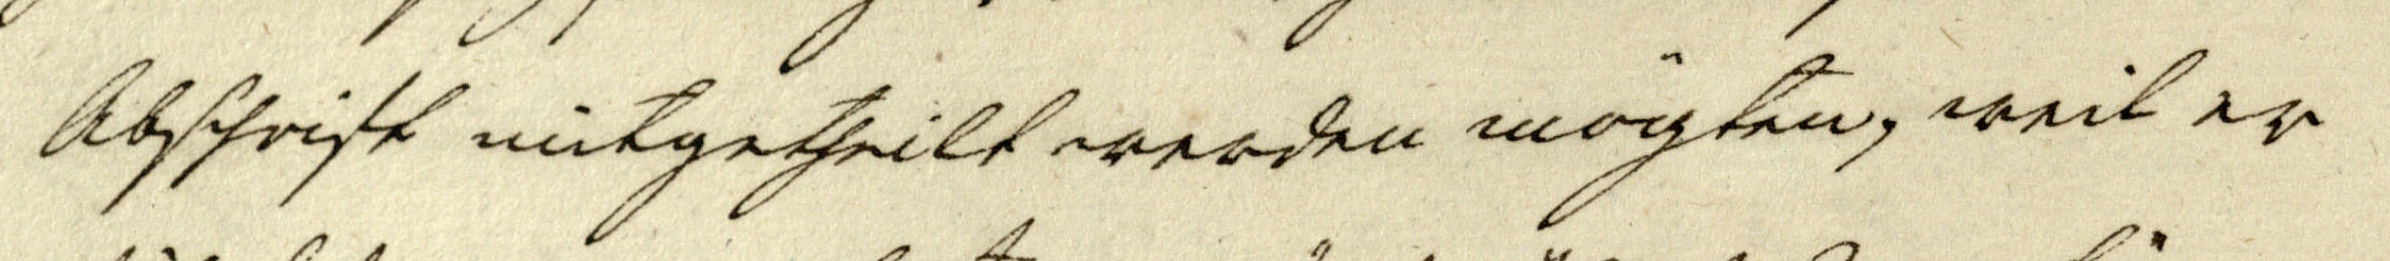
Abschrift mitgetheilt werden mögten, weil er
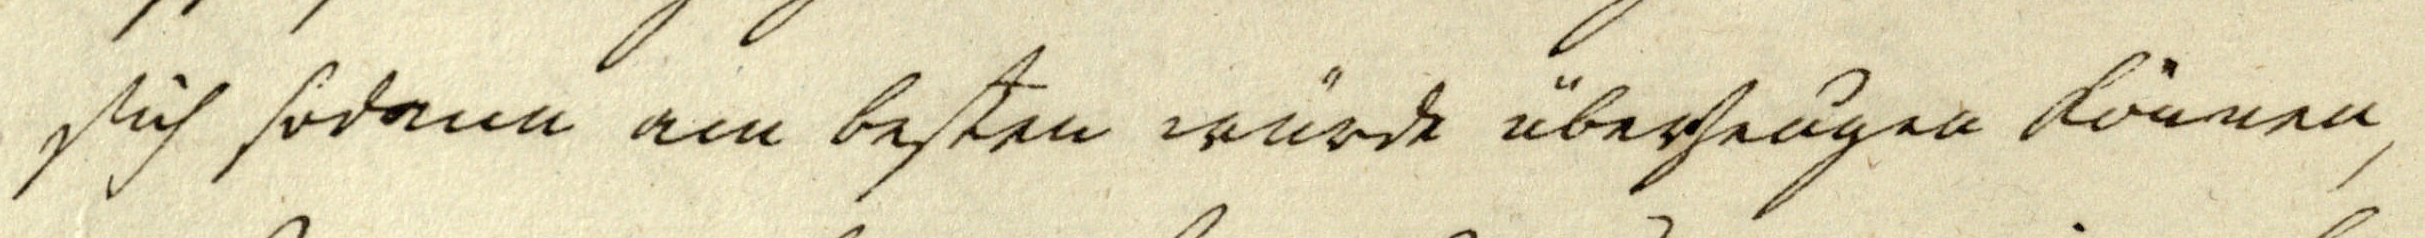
sich sodann am besten würde überzeugen können,
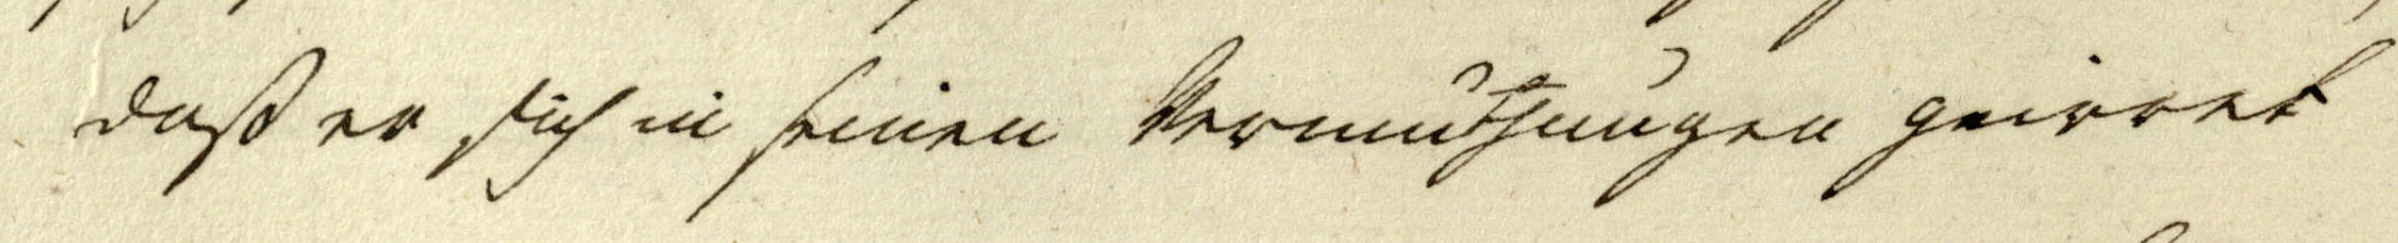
daß er sich in seinen Vermuthungen geirret
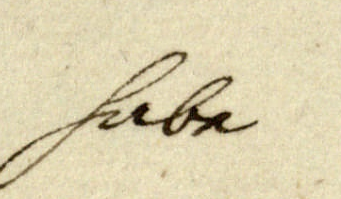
habe
